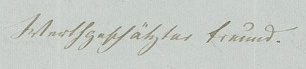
Werthgeschätzter Freund.
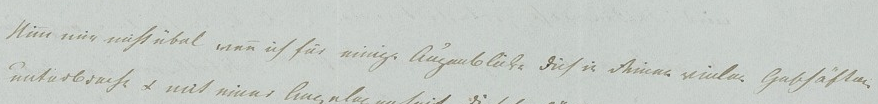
Nimm mir nicht übel wenn ich für einige Augenblicke Dich in Deinen vielen Geschäften
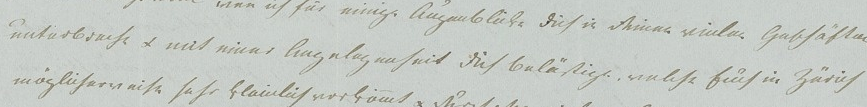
unterbreche & mit einer Angelegenheit Dich belästige, welche Euch in Zürich
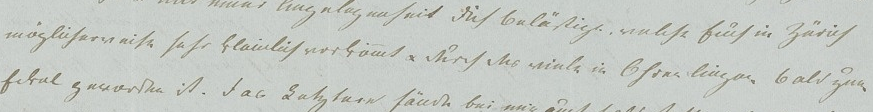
möglicherweise sehr kleinlich vorkommt & durch das viele in Ohren-liegen bald zum
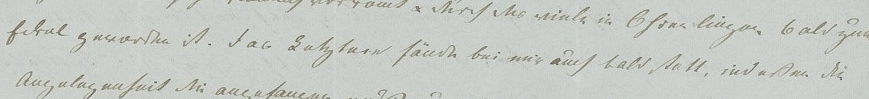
Eckel geworden ist. Das Letztere fände bei mir auch bald statt, indessen die
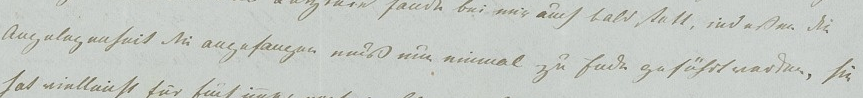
Angelegenheit die angefangen muß nun einmal zu Ende geführt werden, sie
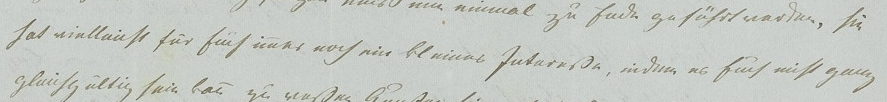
hat vielleicht für Euch immer noch ein kleines Interesse, indem es Euch nicht ganz
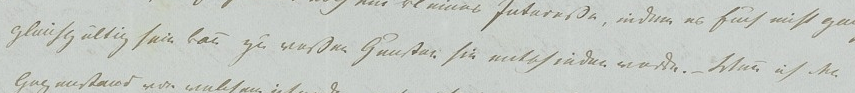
gleichgültig sein kann zu wessen Gunsten sie entschieden werde. – Wenn ich den
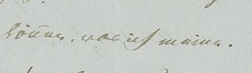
können, was ich meine.
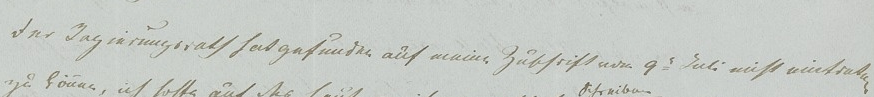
Der Regierungsrath hat gefunden auf meine Zuschrift vom 9ten Juli nicht eintreten
